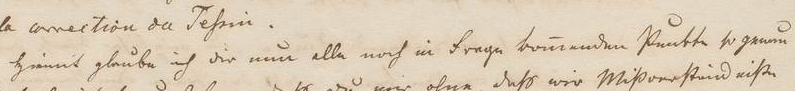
Hiemit glaube ich Dir nun alle noch in Frage kommenden Punkte so genau
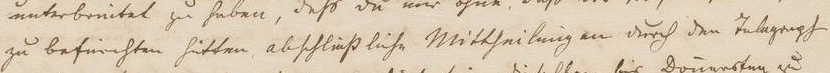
zu befürchten hätten, abschließliche Mittheilungen durch den Telegraph
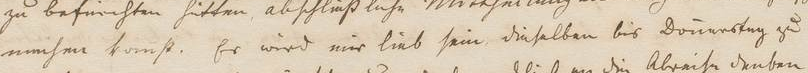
machen kannst. Es wird mir lieb sein, dieselben bis Donnerstag zu
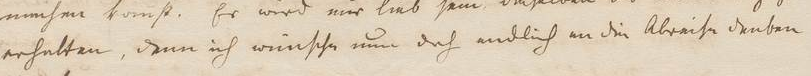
erhalten, denn ich wünsche nun doch endlich an die Abreise denken
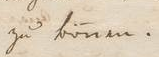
zu können.
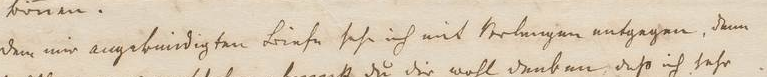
Dem mir angekündigten Briefe sehe ich mit Verlangen entgegen, denn
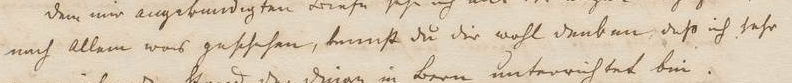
nach Allem was geschehen, kannst Du Dir wohl denken, daß ich sehr
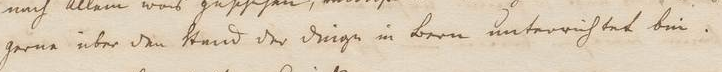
gerne über den Stand der Dinge in Bern unterrichtet bin.
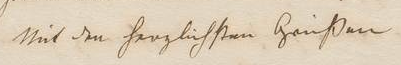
Mit den herzlichsten Grüßen
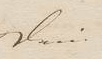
Dein
